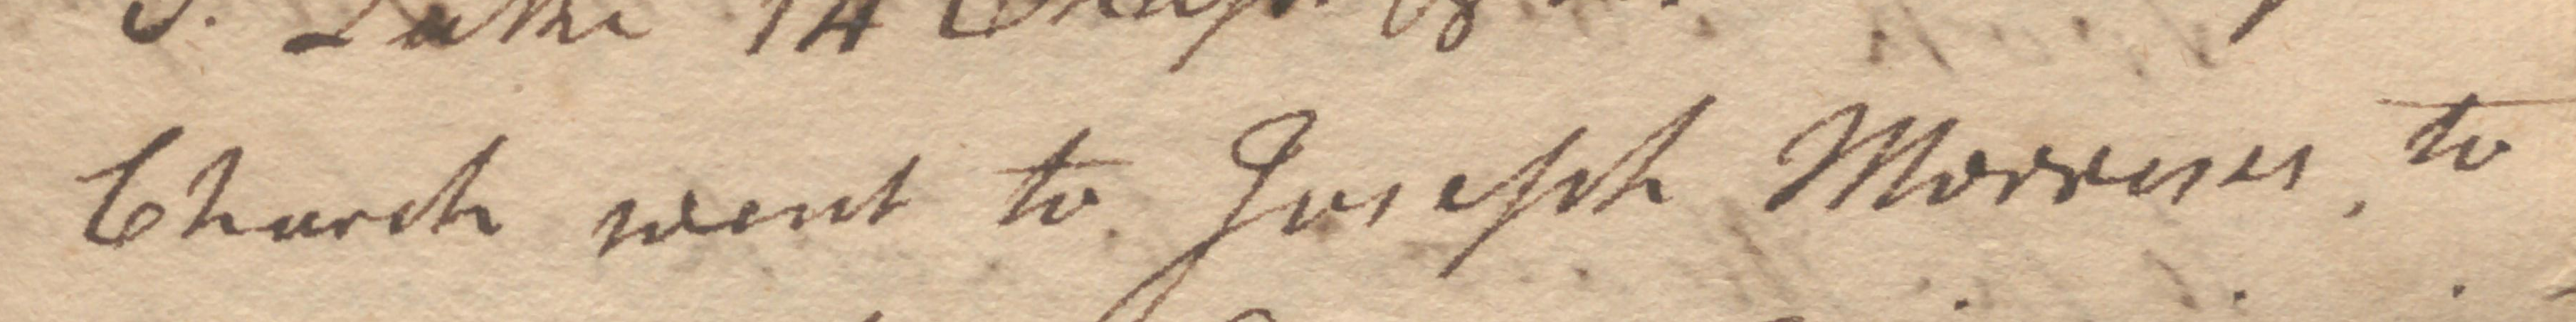Church went to Joseph Morrises to
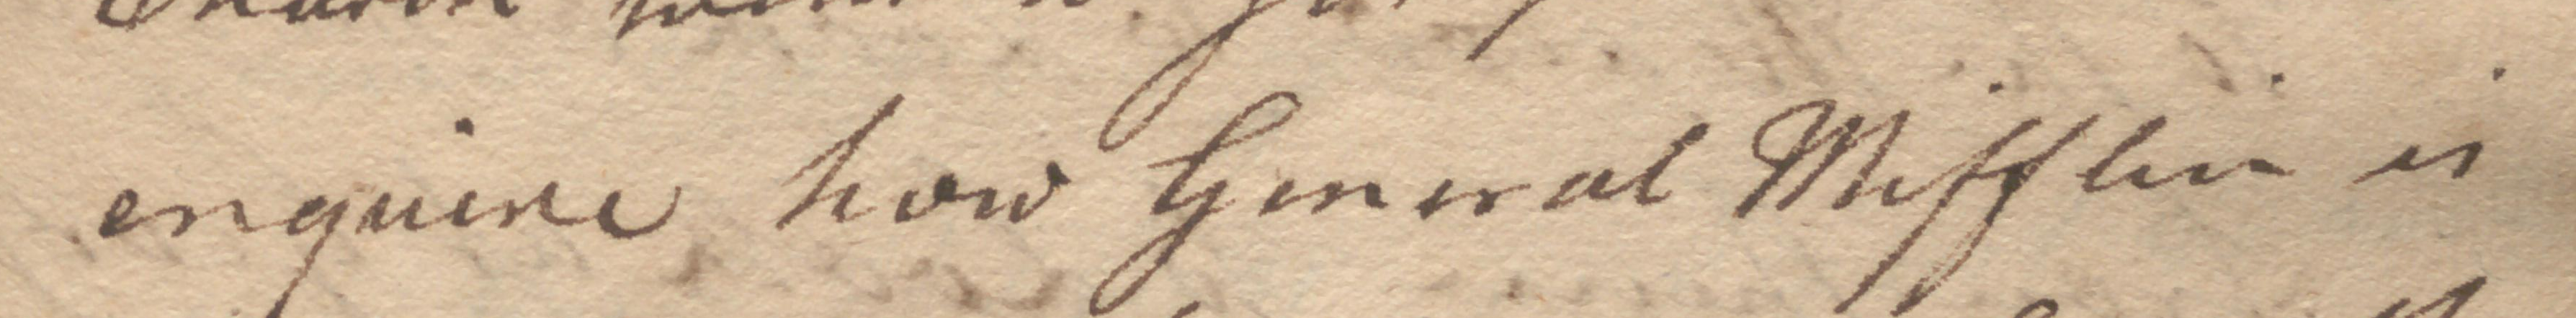enquire how General Mifflin is
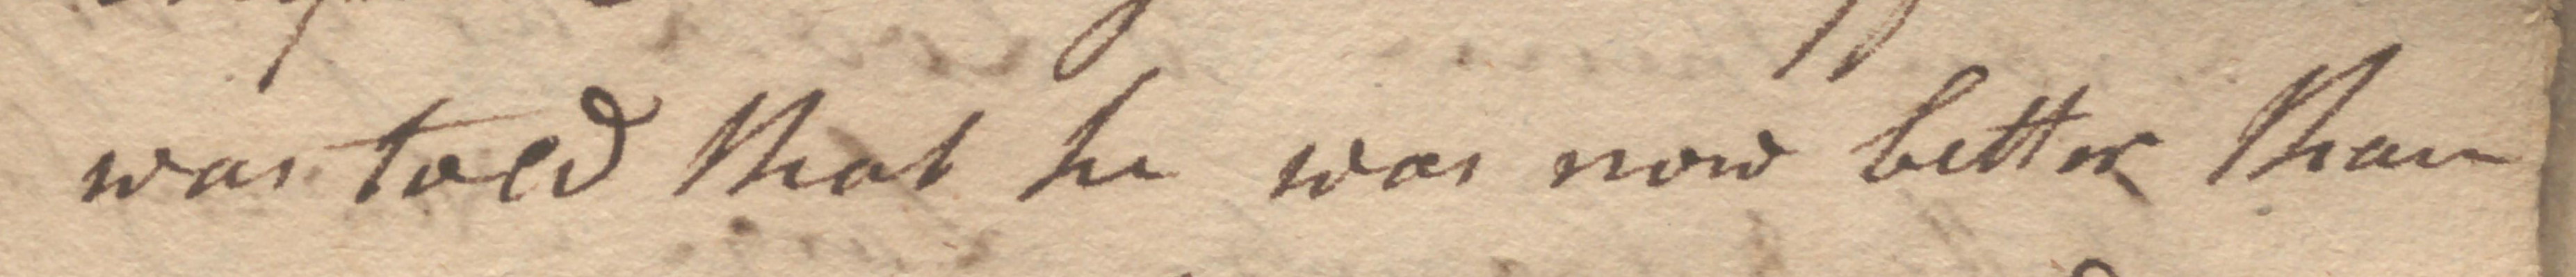was told that he was now better than
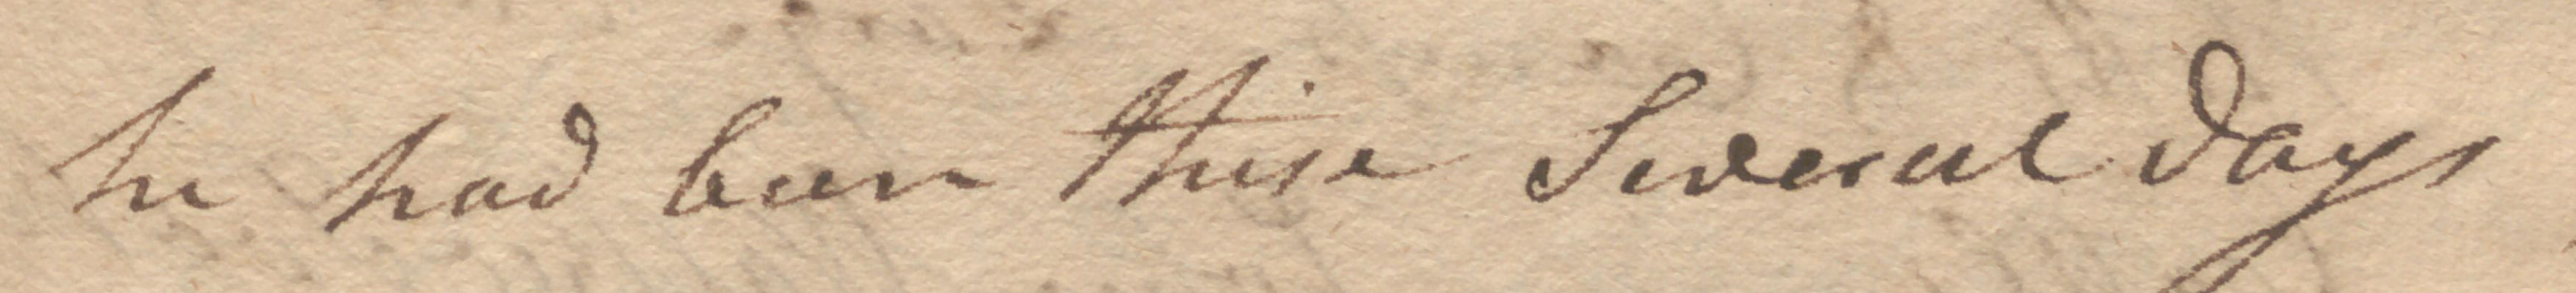he had been thise Several days
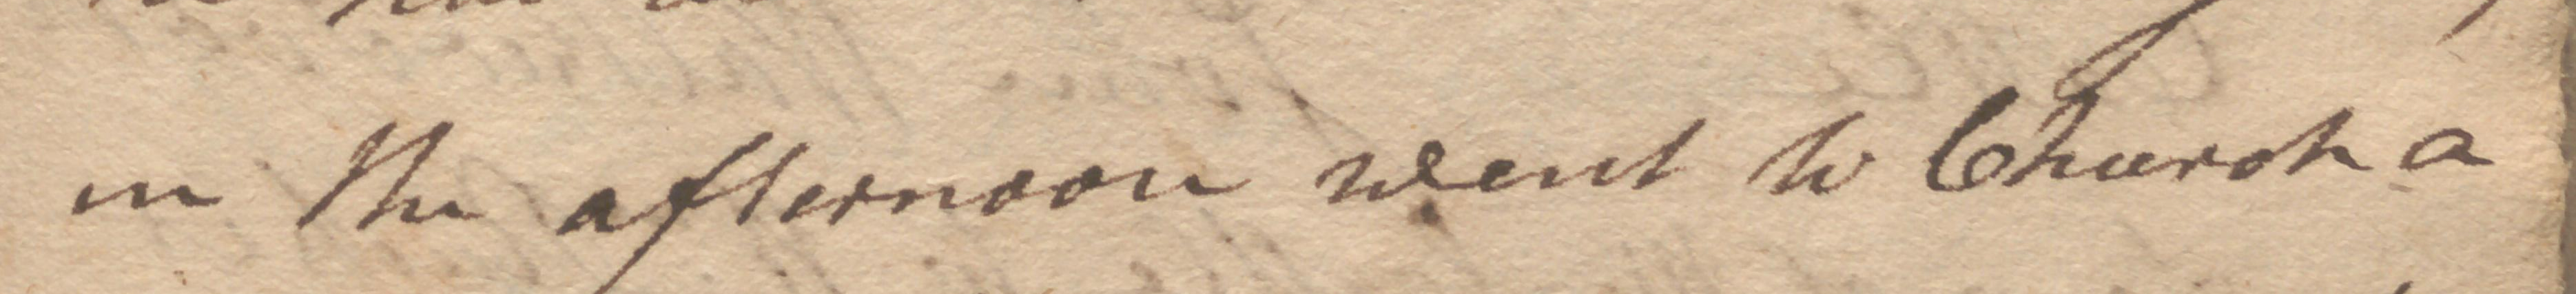in the afternoon went to Church a
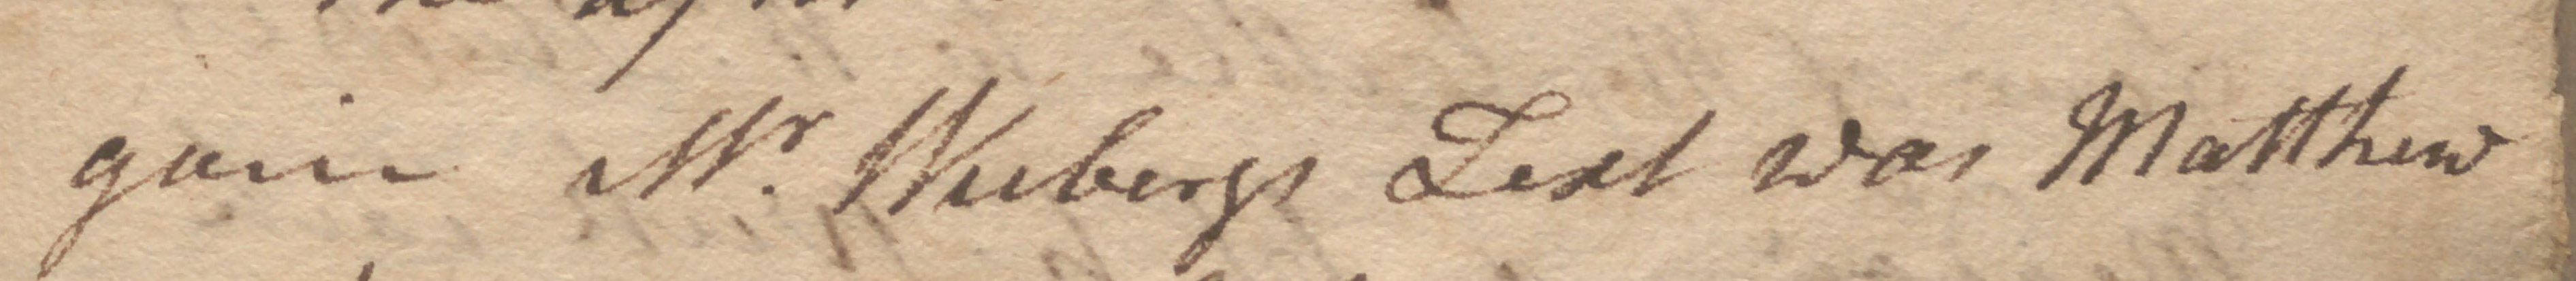gain M^r. Weibergs Text was Matthew
